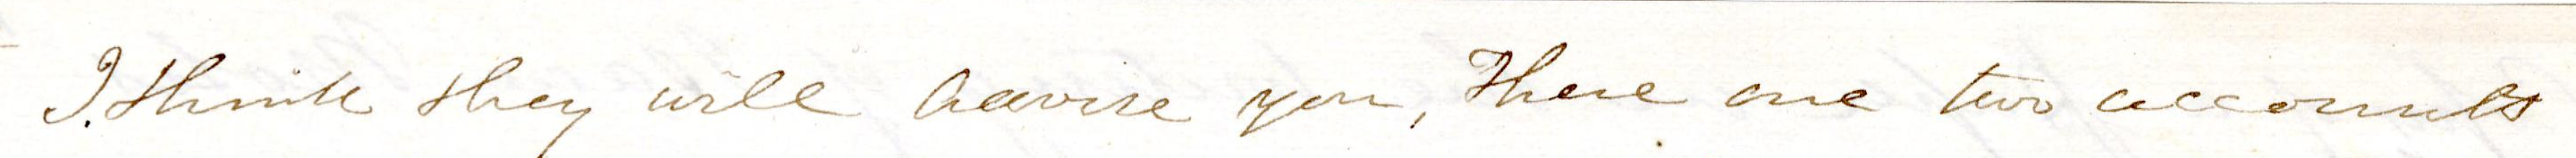I think they will Advise you, There one two accounts
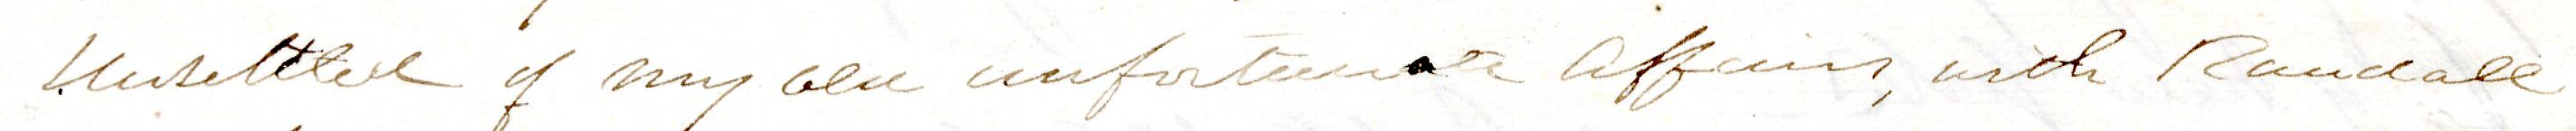Unsettled of my all unfortunate affairs with Randall
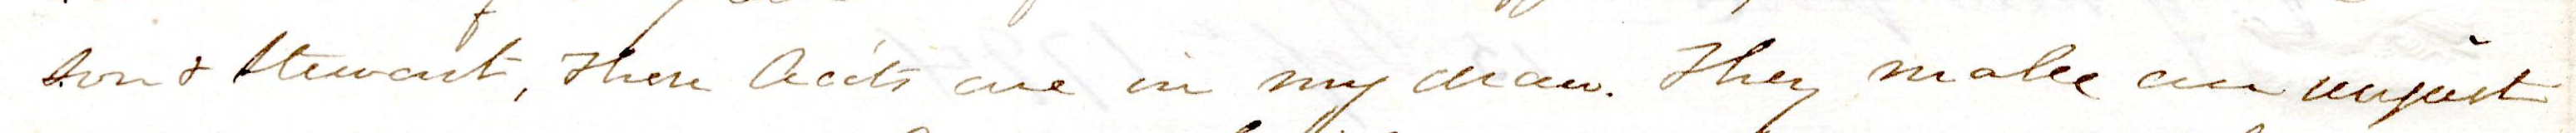acc^t merchant, these Acc^ts are in my draw. they made an unjust
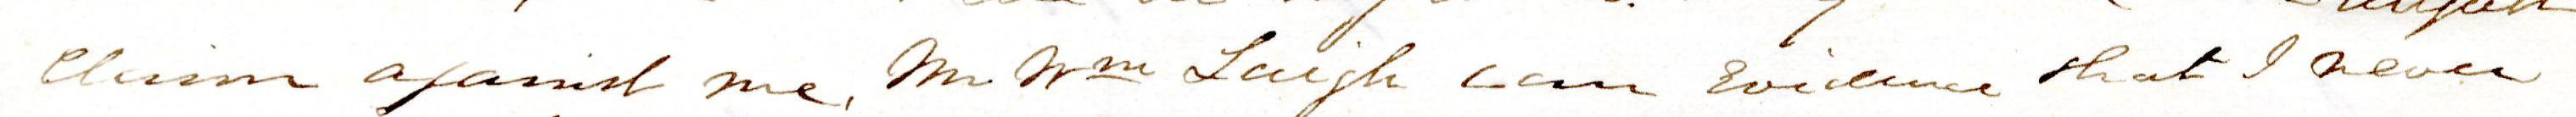claim against me, Mr W^m Laigh can evidence that I never
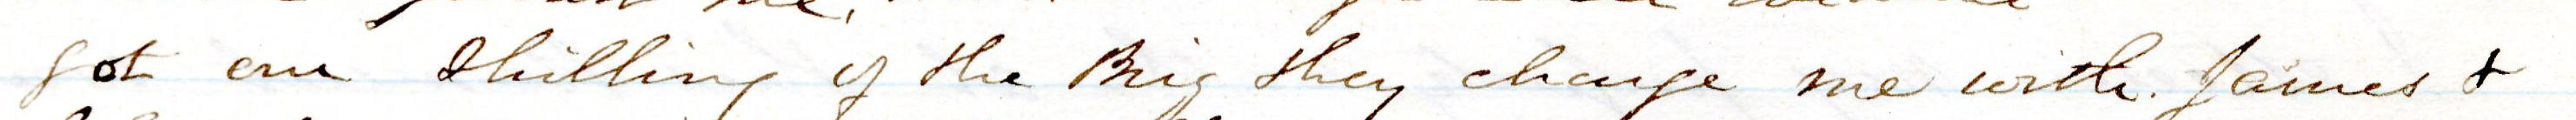got one shilling of the Brig they charge me with. James &
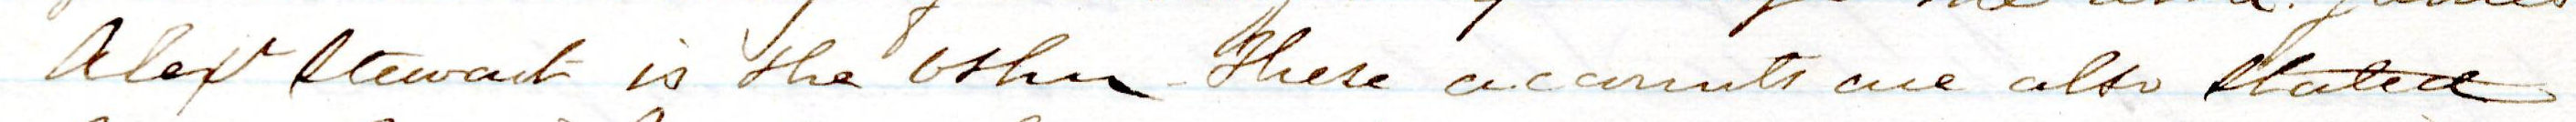Alex^r Stewart is the other these accounts are also stated
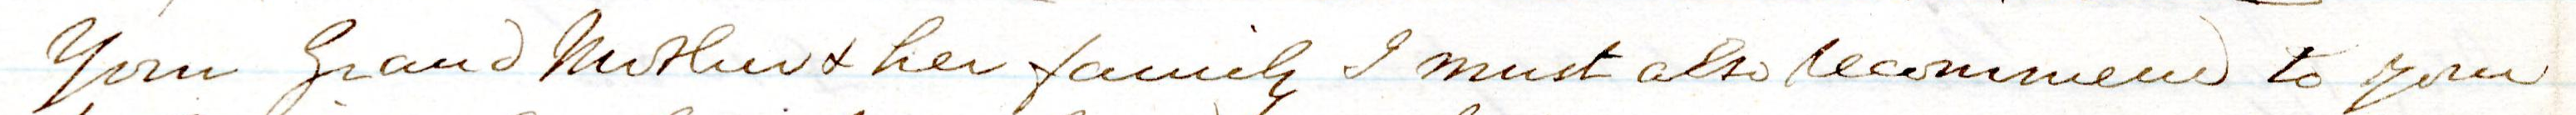your Grand mother & her family I must recommend to your
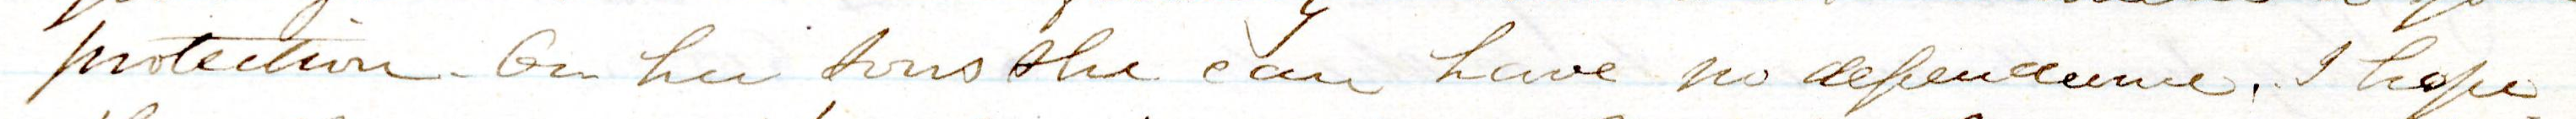protection on her first she can have no dependence, I hope
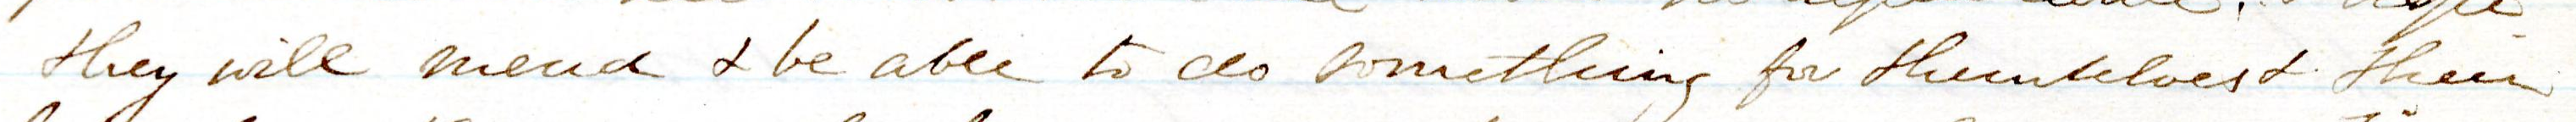they will mend & be able to do something for themselves & their
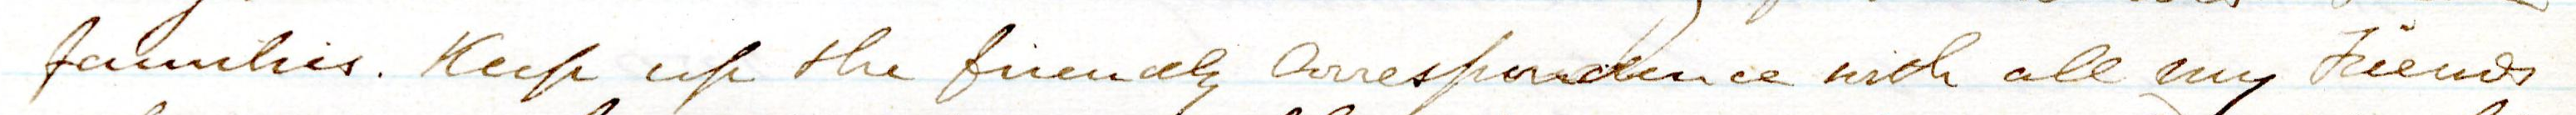families. Keep up the friendly Correspondence with all my Friends
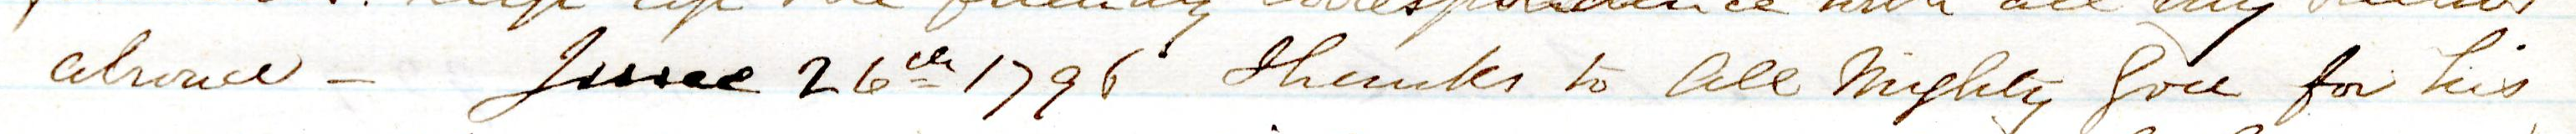absence.- June 26^th 1796 Thanks to all mighty God for his
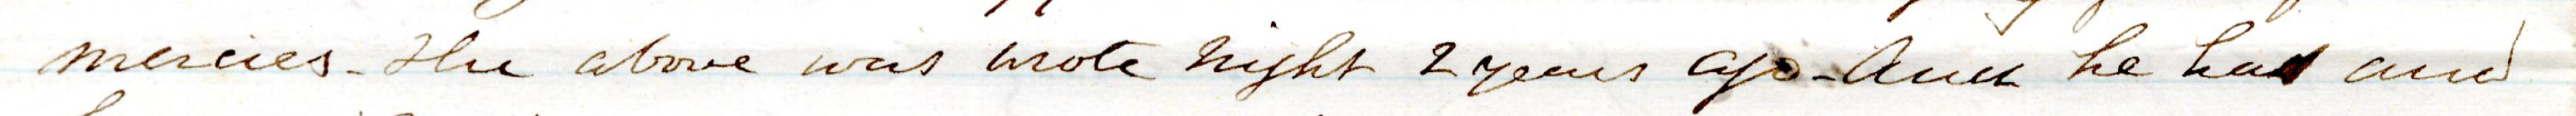mercies- the above was wrote night 2 years ago. And he has acco^t
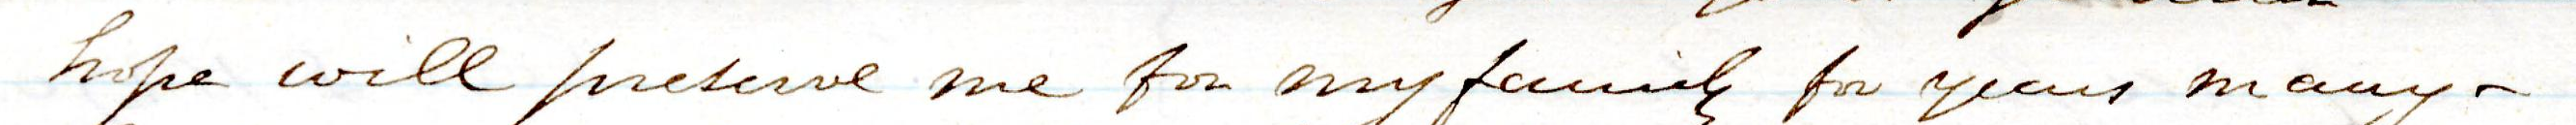hope will preserve me for my family for years many-
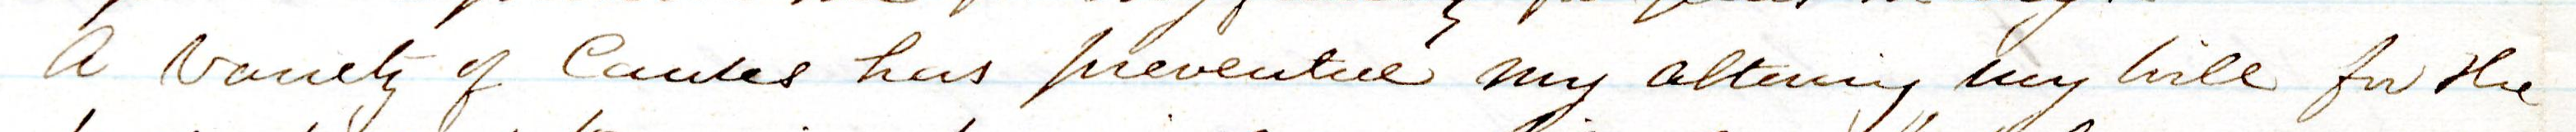A variety of Causes has prevented my attorney any bill for the
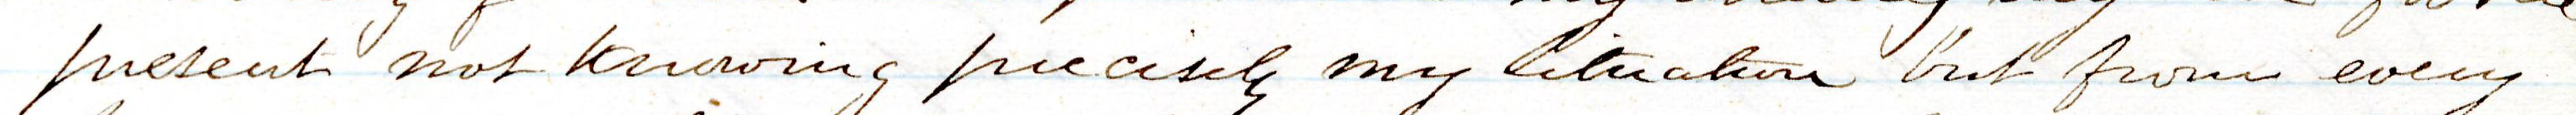present not knowing precisely my situation but from every
